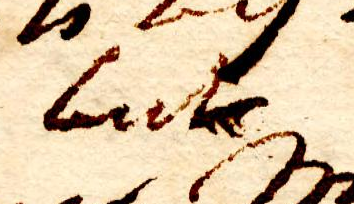back
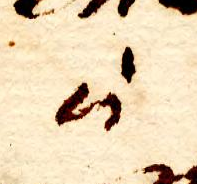is
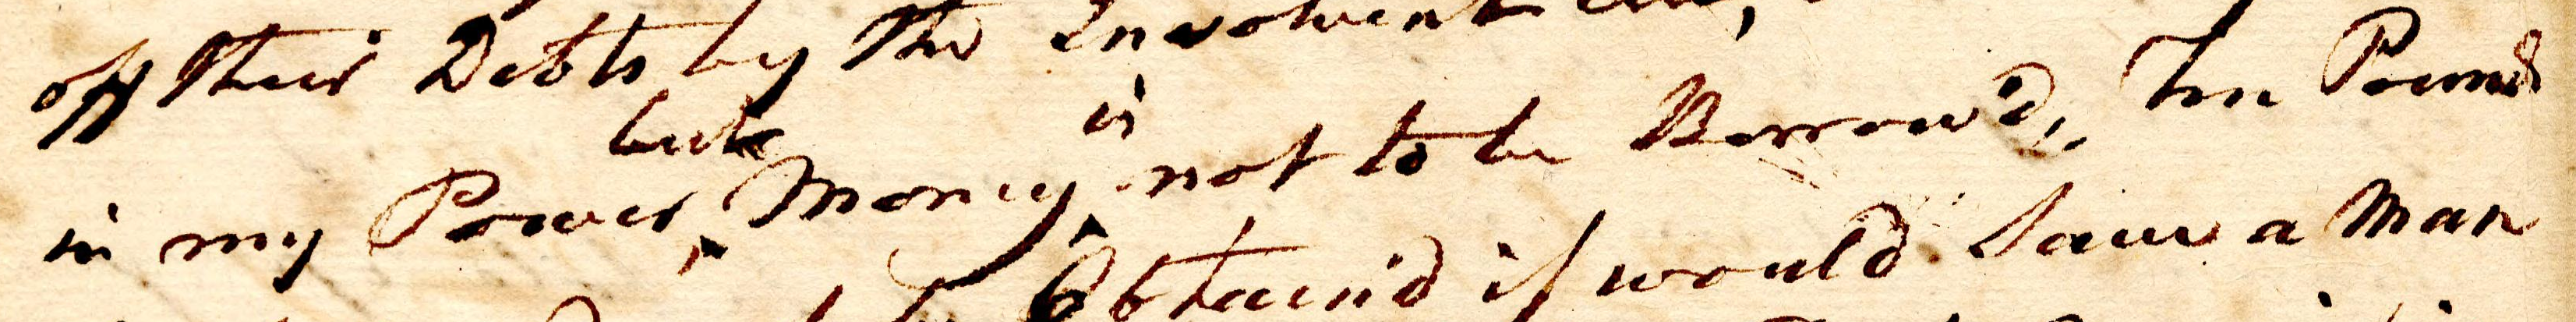in my Power Money ^ not to be Borrowd. The Penn^a
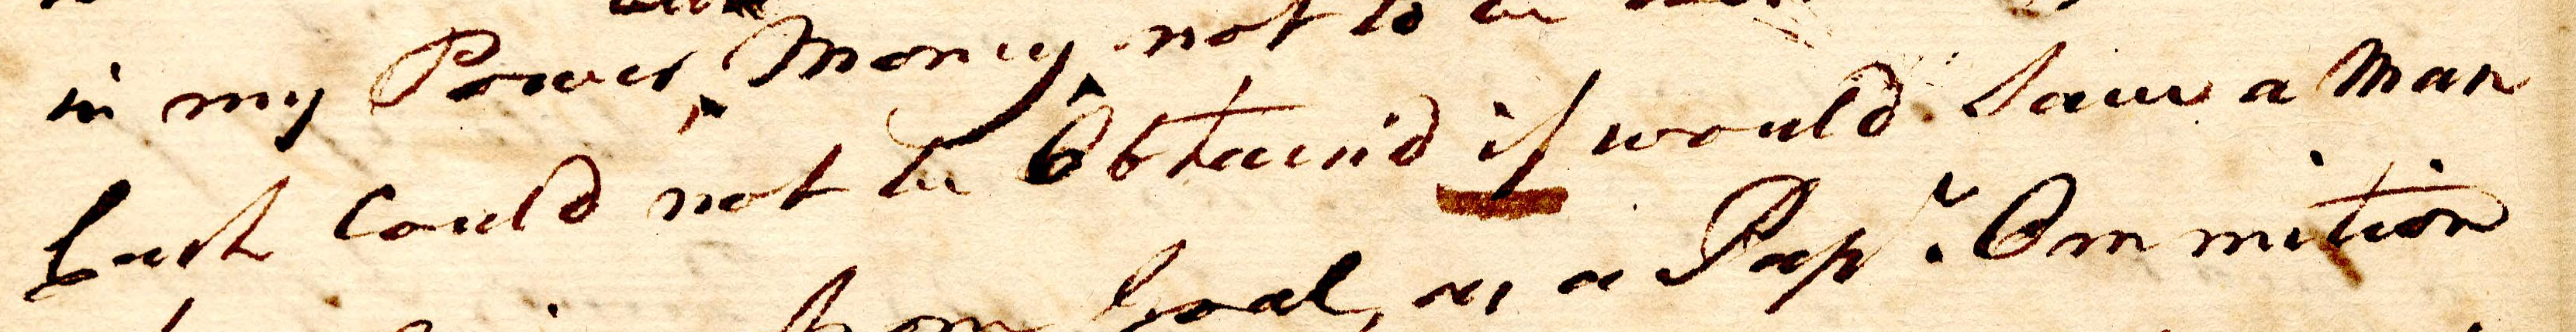Cash could not be obtain'd if would save a man
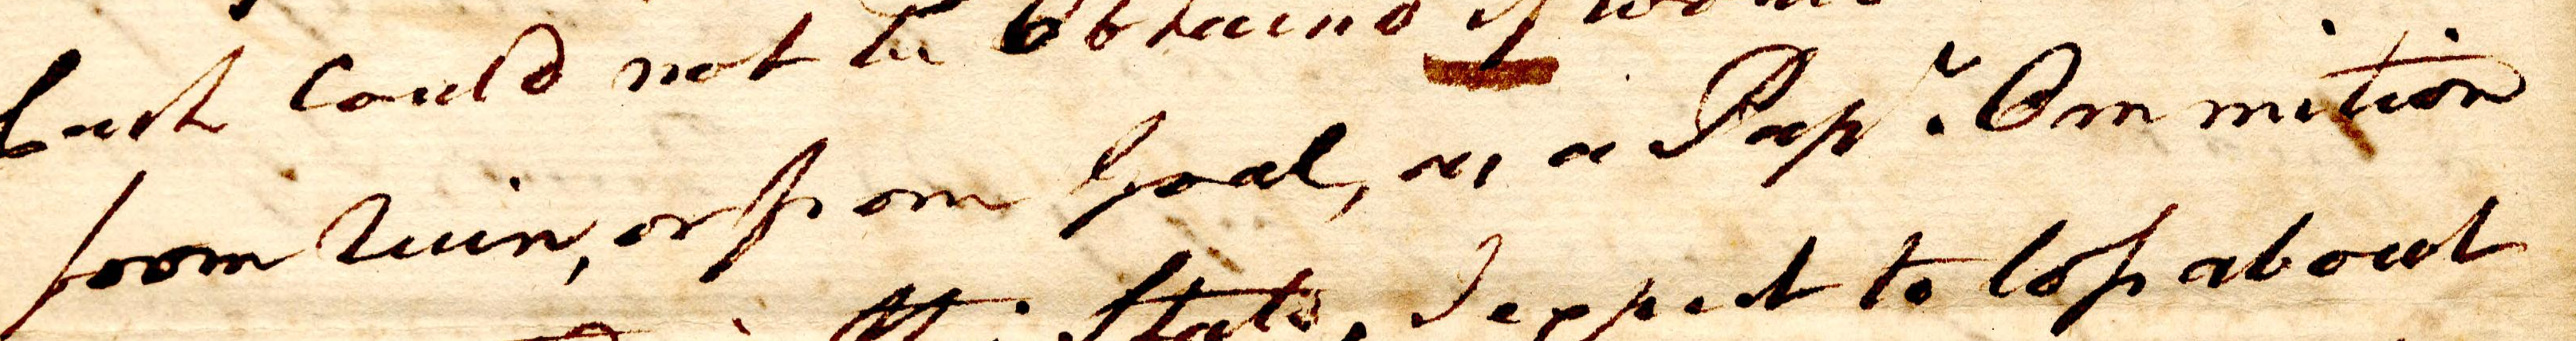from ruin, or from Gaol, as a Pap^r. Omnition
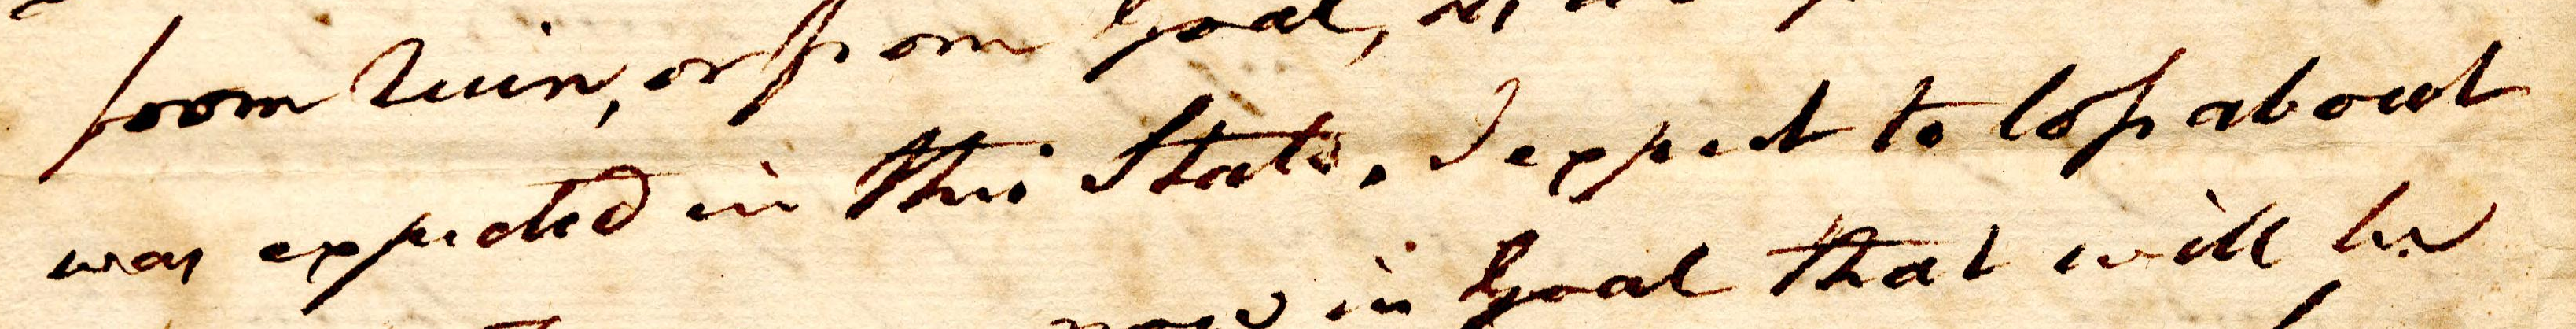was expected in this State, I expect to loss about
